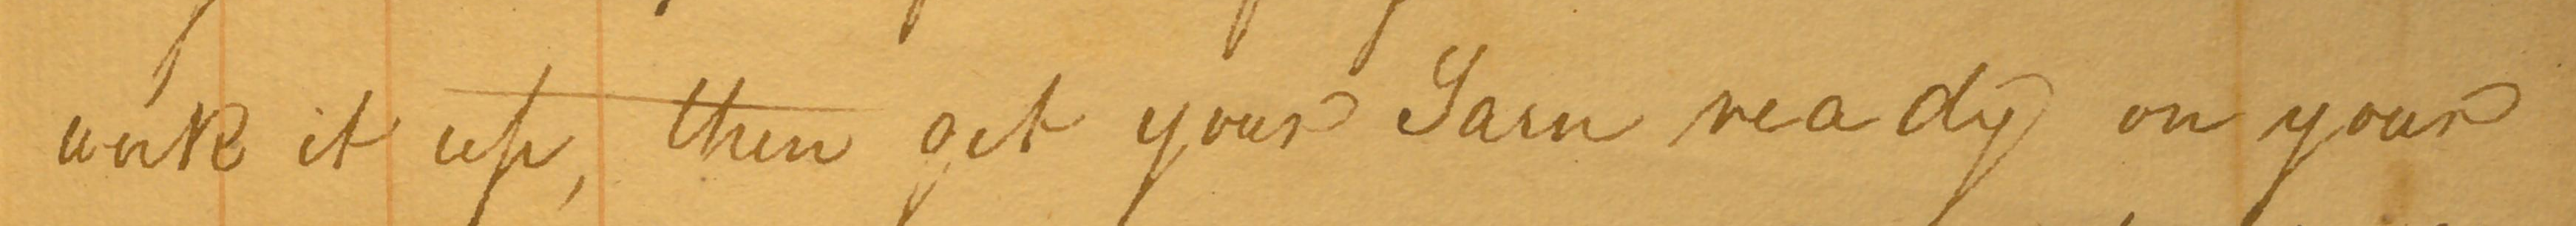wick it up, then get your Yarn ready on your
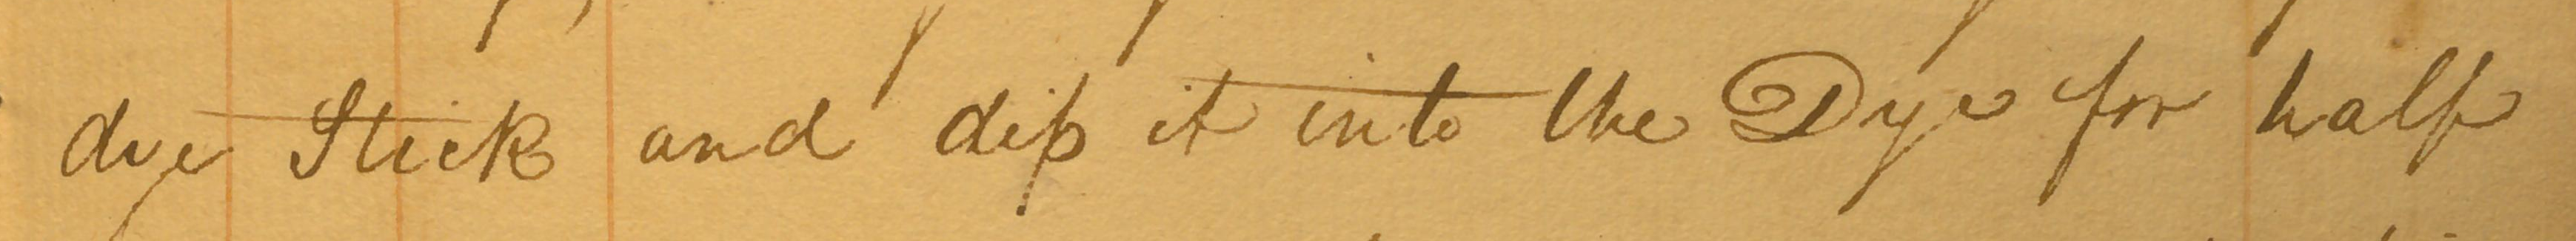dye Stick and dip it into the Dye for half
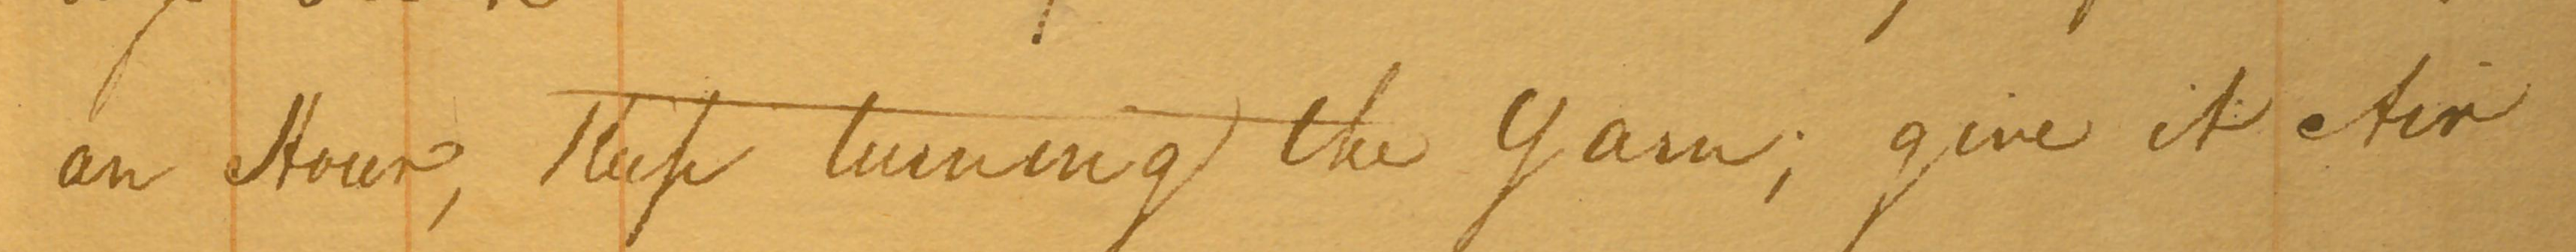an Hour, Keep turning the yarn; give it Air
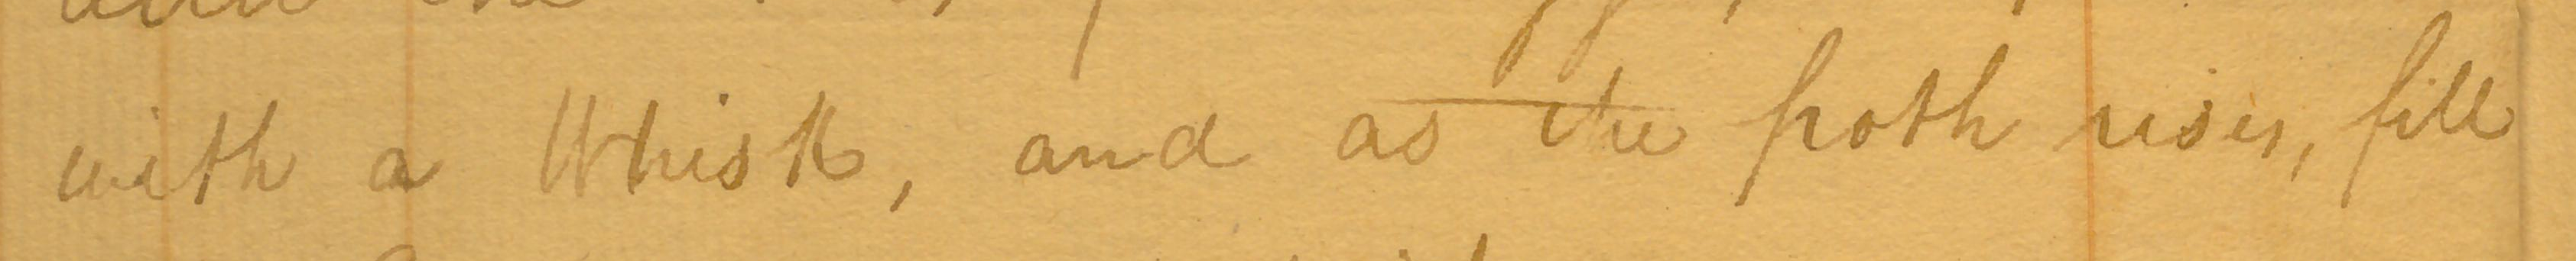with a Whisk, and as the froth rises, fill
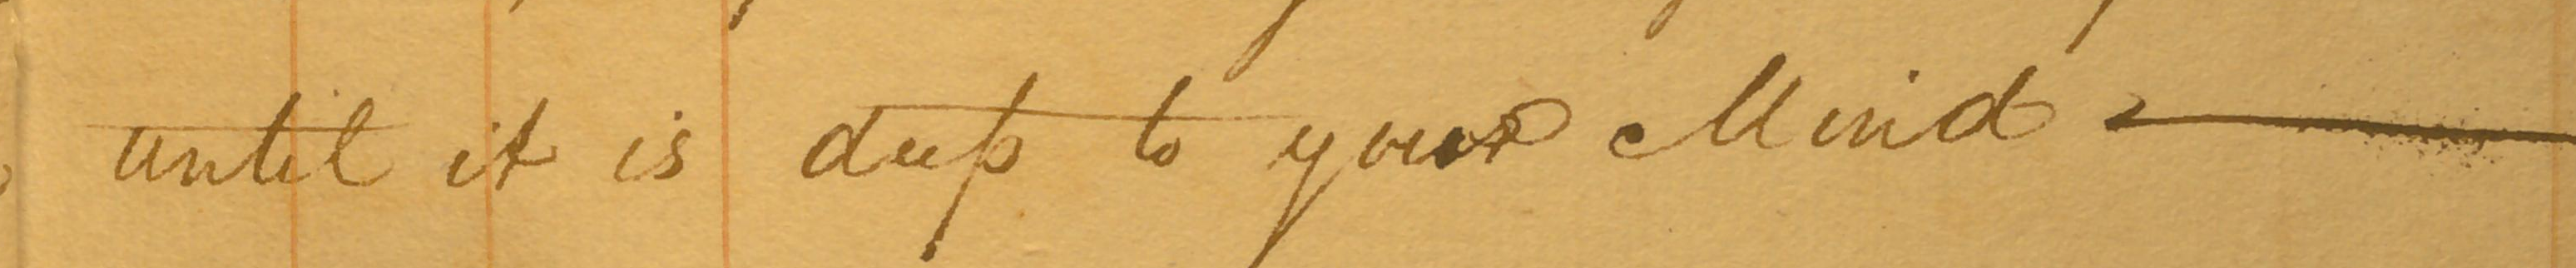until it is deep to your Mind
